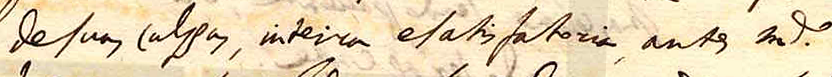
de suas culpas, inteira e satisfatoria, antes mt.o
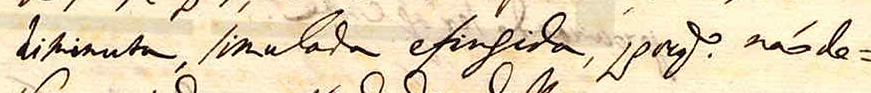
diminuta, simulada e fingida, porq.to naõ de
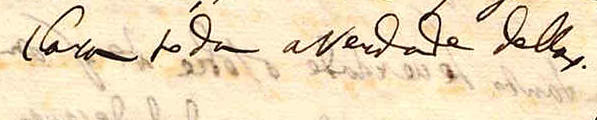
clara toda a verdade dellas.
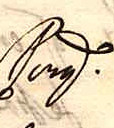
Porq.to
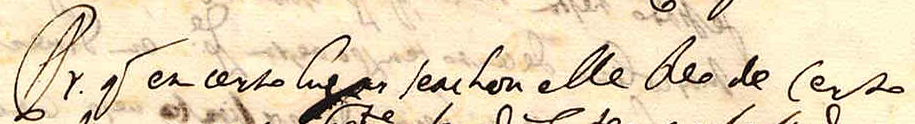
Pr. q̄ em certo lugar se achou elle Reo de Certo
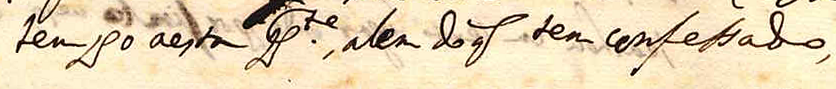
tempo a esta p.te, alem do q̄ tem confessado,
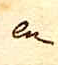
en
